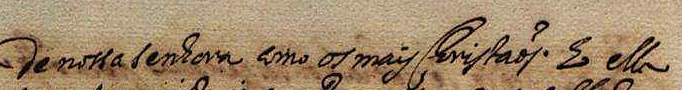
de nossa senhora como os mais Christaõs. E ella
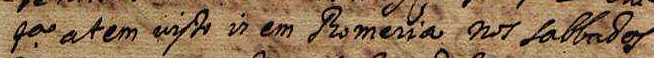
t.a a tem uisto ir em Romeria nos sabbados
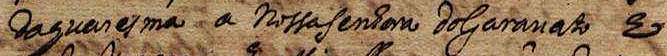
da quaresma a nossa senhora do Garauato E
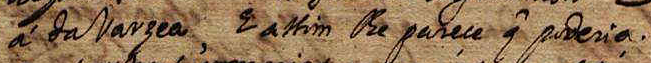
á da Varzea, E assim lhe parece q̄ poderia
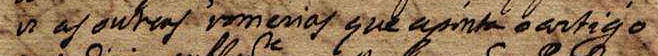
ir as outras romerias que aponta o artigo
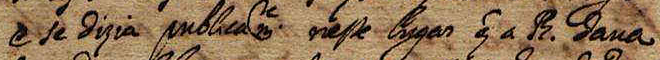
e se dizia publicamte. neste lugar q̄ a R. daua
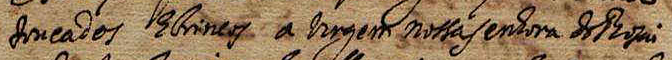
toucados E brincos a virgem nossa senhora do Rozai
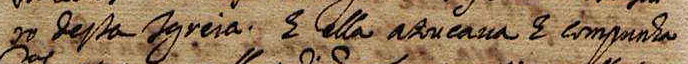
ro desta Igreia. E ella a toucaua E compunha
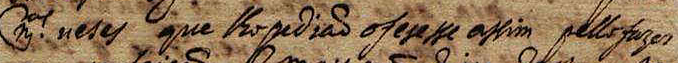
mtas. ueses que lho pediaõ o fesesse assim pello fazer
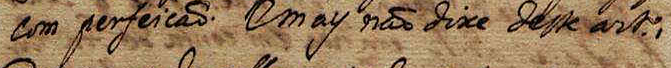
com perfeiçaõ. E mais não dixe deste arto.
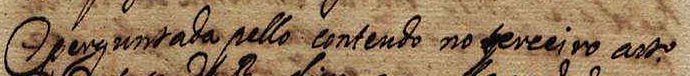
E perguntada pello conteudo no terceiro art.o
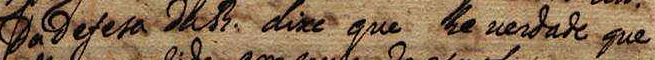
da defesa da R. dixe que he uerdade que
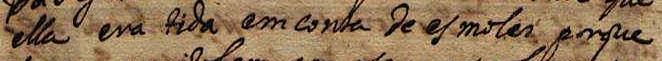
ella era tida em conta de esmolas porque
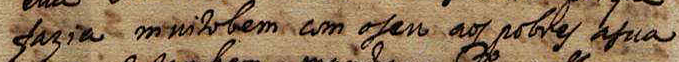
fazia muito bem com o seu aos pobres a sua
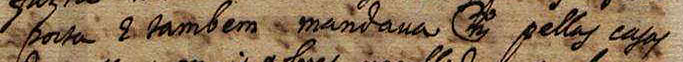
porta E tambem mandaua mto pellas casas
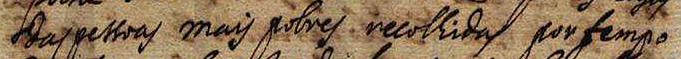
das pessoas mais pobres recolhidas por tempo
